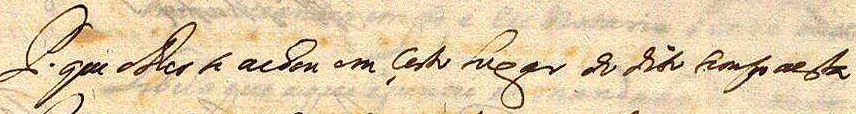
P. que o Reo se achou em certo lugar do dito tempo a esta
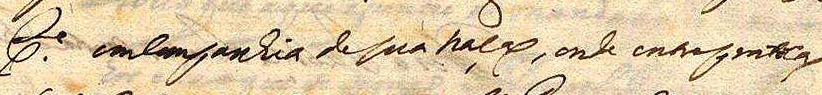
p.te em companhia de sua naçaõ, onde entre praticas
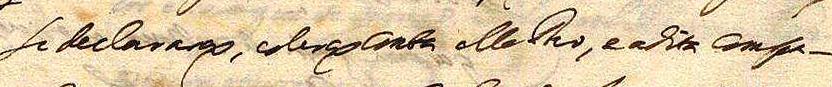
se declararaõ, e deraõ conta elle Reo, e a dita compa
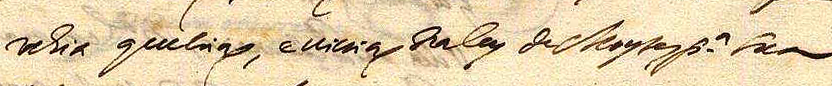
nhia que criaõ, e uiuiaõ na ley de Moyses p.a sua
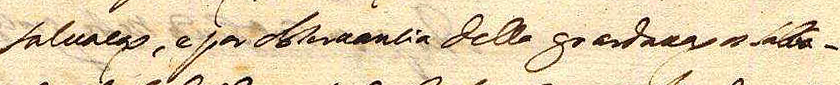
saluaçaõ, e por obseruancia della goardauaõ os sabba
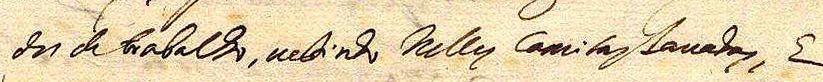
dos de trabalho, uestindo nelles camisas lauadas, E
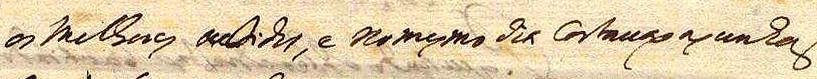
os melhores uestidos, e no mesmo dia cortauaõ as unhas
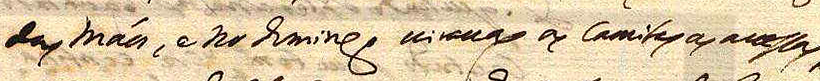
das maõs, e no domingo uirauaõ as camisas as auessas,
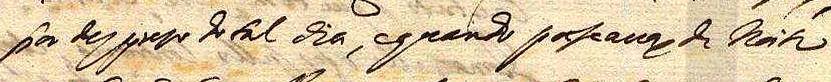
por desprezo do tal dia, e quando paseauaõ de noite
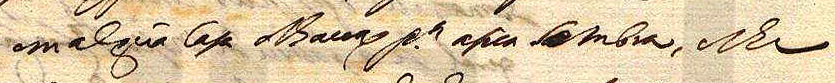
em alguā casa olhauaõ p.a a sua sombra, e lhe
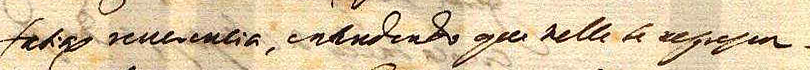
fasiaõ reuerencia, entendendo que nelle se represen
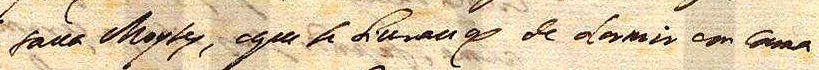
taua Moyses, e que se liurauaõ de dormir em cama
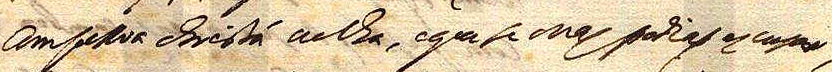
com pessoa christã uelha, e que se o naõ podiaõ escusar,
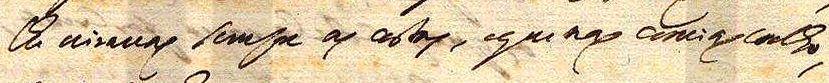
lhe uirauaõ sempre as costas, e que naõ comiaõ coelho,
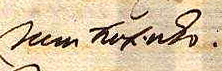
nem tousinho.
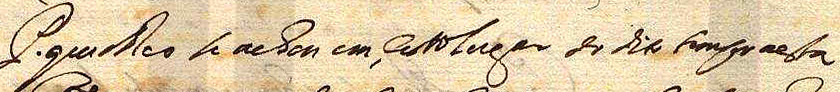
P. que o Reo se achou, em certo lugar do dito tempo a esta
